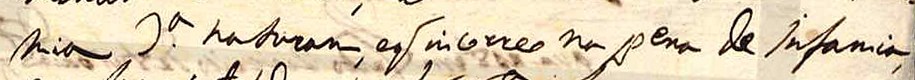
mia ꝯ.a naturam, e q̄ incorreo na pena de Infamia
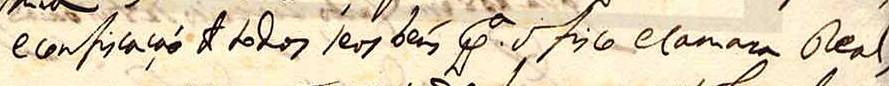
e confiscaçaõ d̄ todos seos bens p.a o fisco e Camara Real
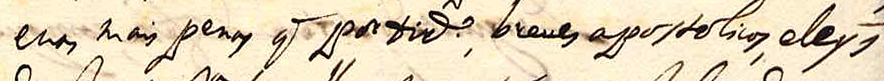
e nas mais penas q̄ por dir̄.o, breues apostolicos e leys
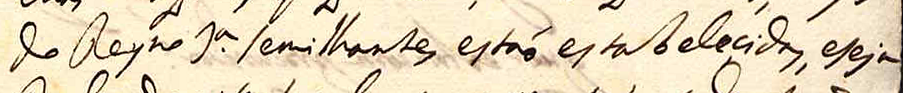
do Reyno ꝯ.a semilhantes estaõ estabelecidas, e seja
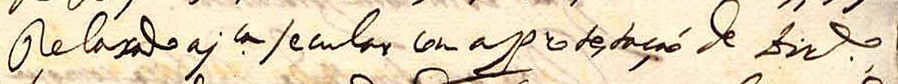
Relaxado a j.ca secular com a protestaçaõ de Dir.to,
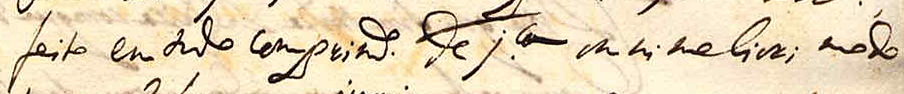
feito em todo comprim.to de j.ca omni melior; modo
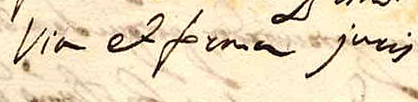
via et forma juris
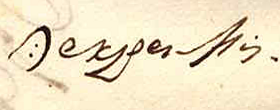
experssis
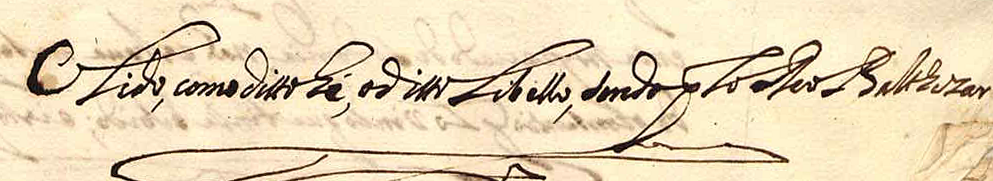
E Lido como ditto he o ditto Libello, sendo plo Reo Balthezar
